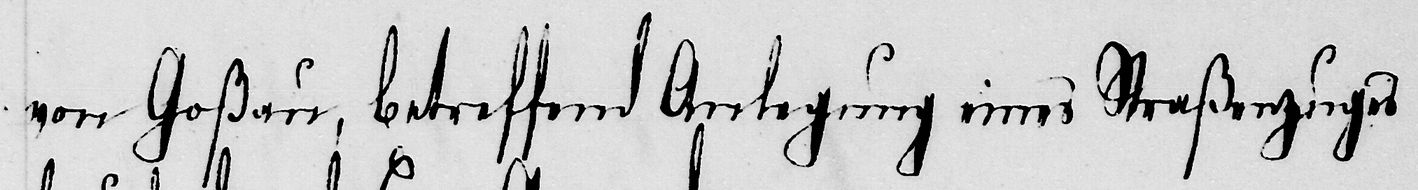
von Goßau, betreffend Anlegung eines Straßenzuges
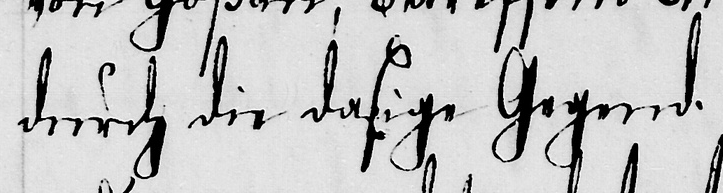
durch die dasige Gegend.
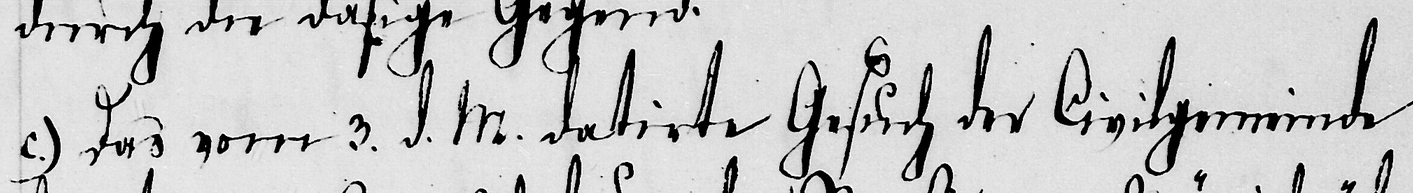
d.) Das vom 3. d. M. datirte Gesuch der Civilgemeinde
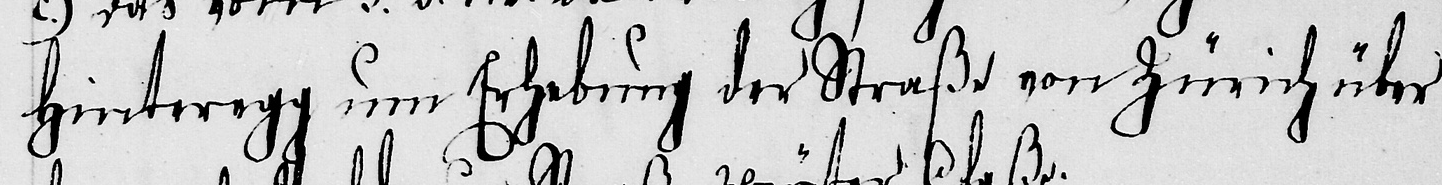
Hinteregg um Erhebung der Straße von Zürich über
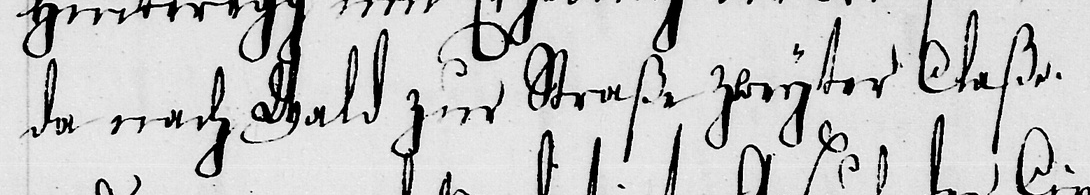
da nach Wald zur Straße zweyter Claße.
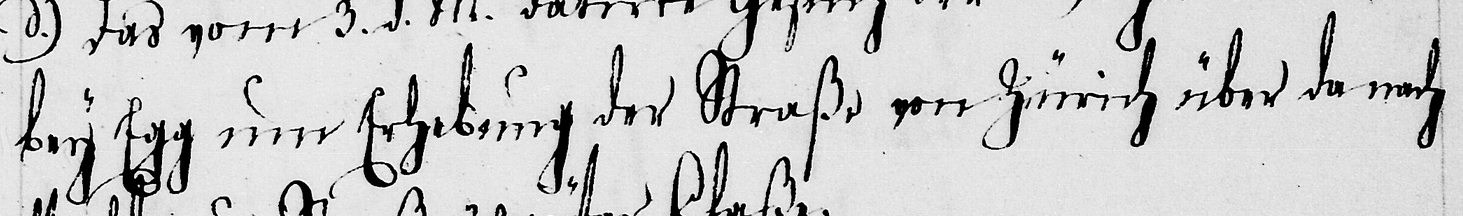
bey Egg um Erhebung der Straße von Zürich über da nach
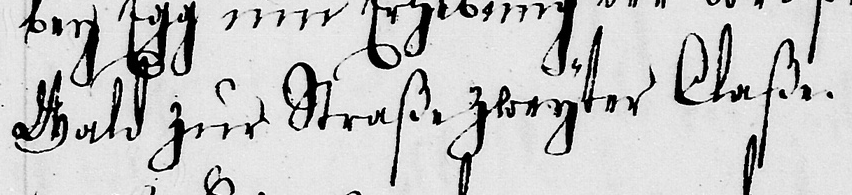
Wald zur Straße zweyter Claße.
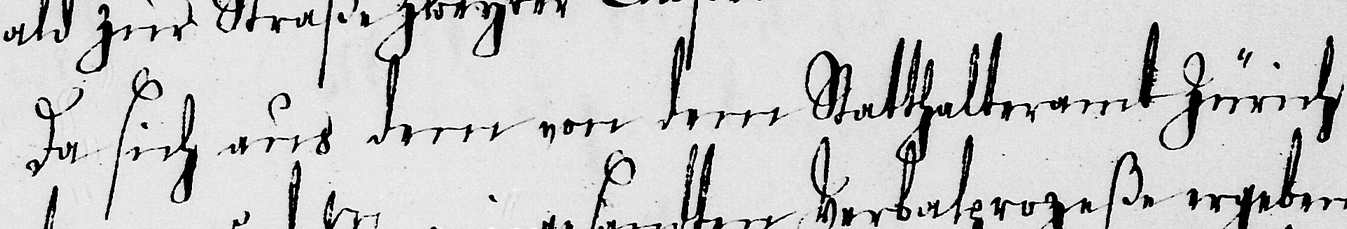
Da sich aus dem von dem Statthalteramt Zürich
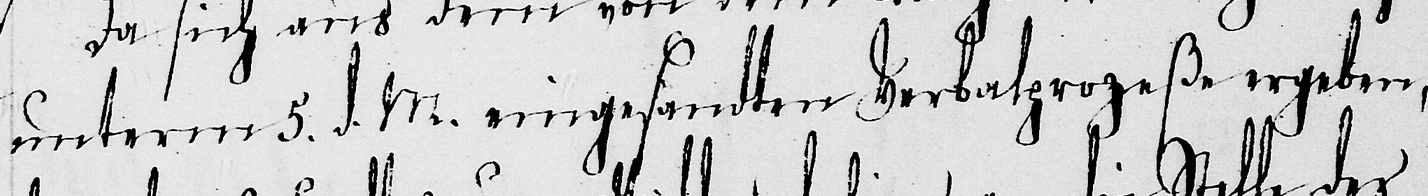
unterm 5. d. M. eingesandten Verbalprozeße ergeben,
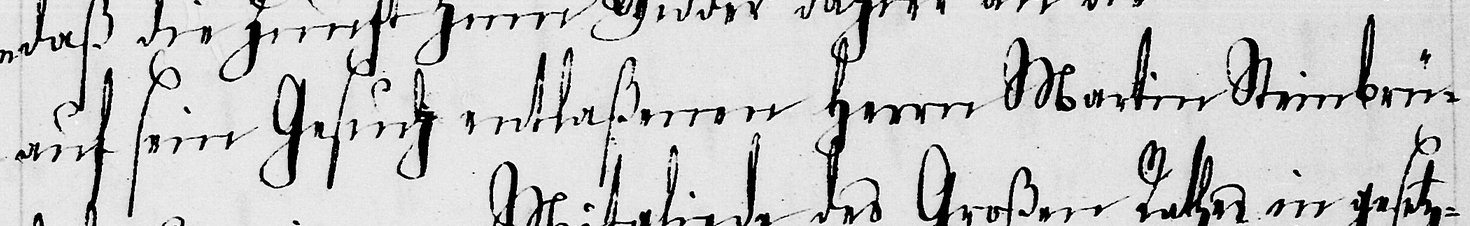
auf sein Gesuch entlaßenen Herrn Martin Steinbrü¬
